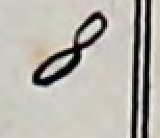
8
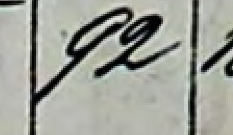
92
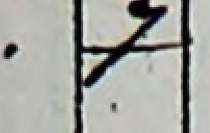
7
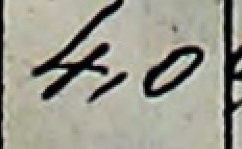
4,0
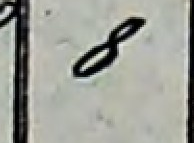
8
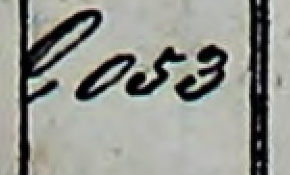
0,053
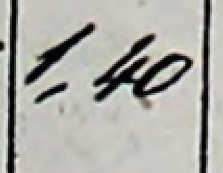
1,40
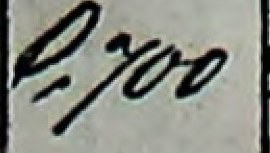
0,700
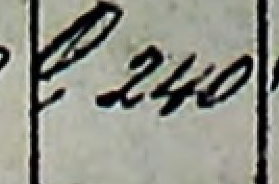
0,240
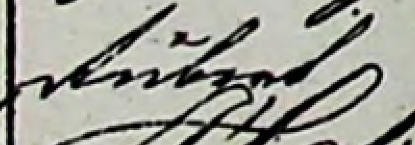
Dubert
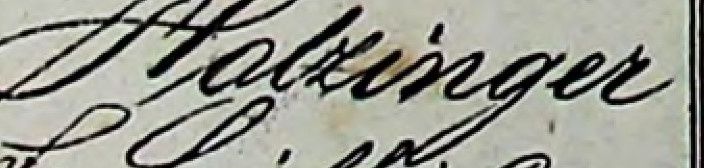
Halzinger
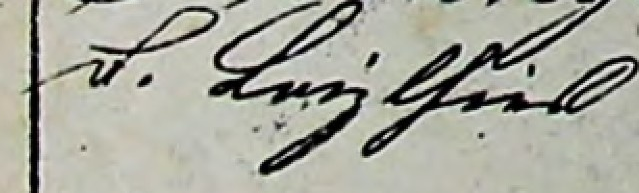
v. Loizlhirs
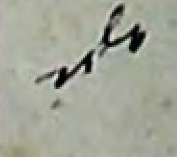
do
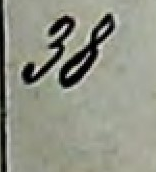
38
